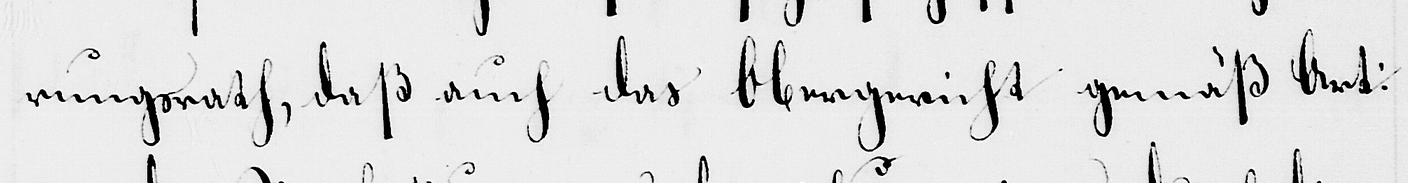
rungsrath, daß auch das Obergericht gemäß Art:
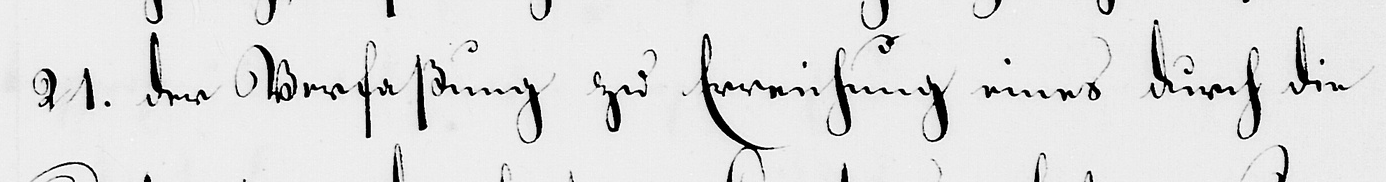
21. der Verfaßung zu Erreichung eines durch die
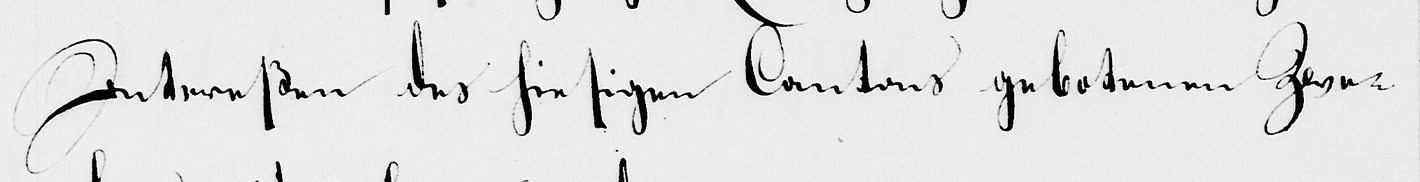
Intereßen des hiesigen Cantons gebotenen Zwe¬
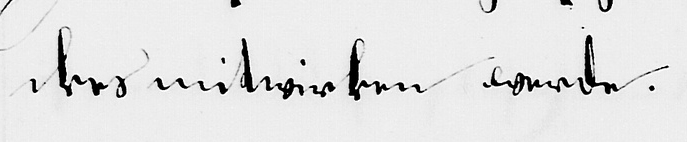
ckes mitwirken werde.
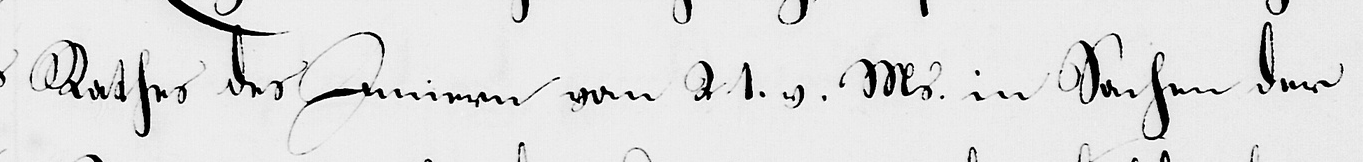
Rathes des Innern vom 21. v. Ms. in Sachen der
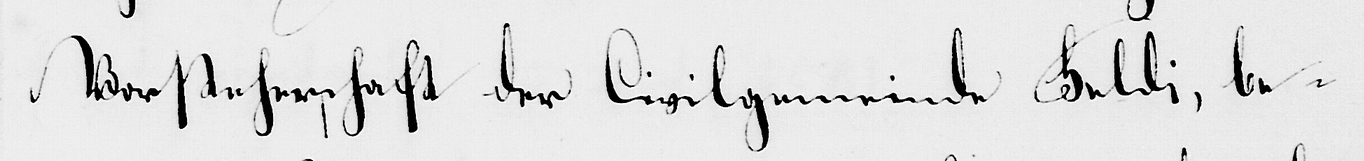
Vorsteherschaft der Civilgemeinde Feldi, be¬
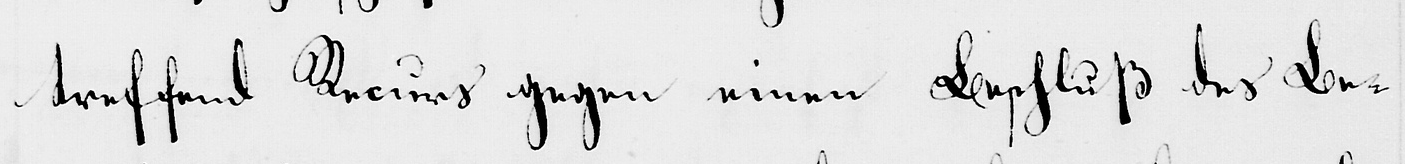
treffend Recurs gegen einen Beschluß des Be¬
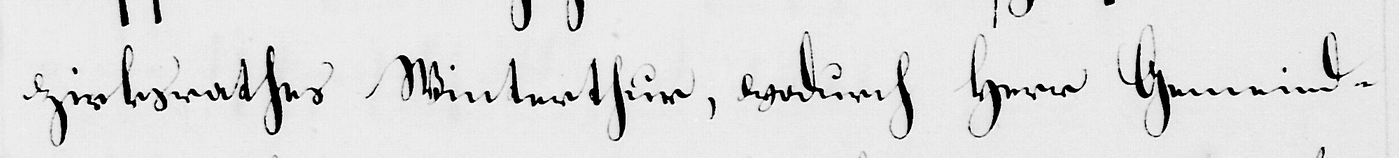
zirksrathes Winterthur, wodurch Herr Gemeind¬
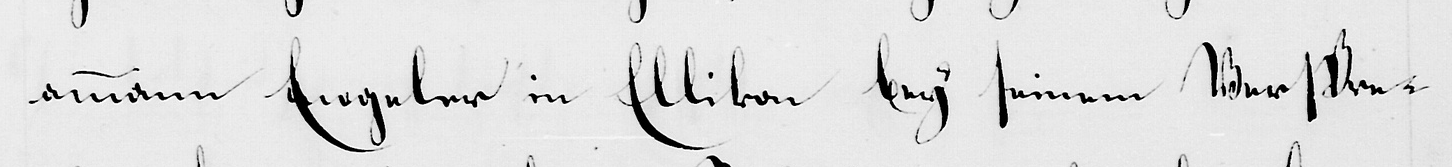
ammann Engeler in Ellikon bey seinem Verspre¬
